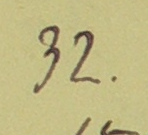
32
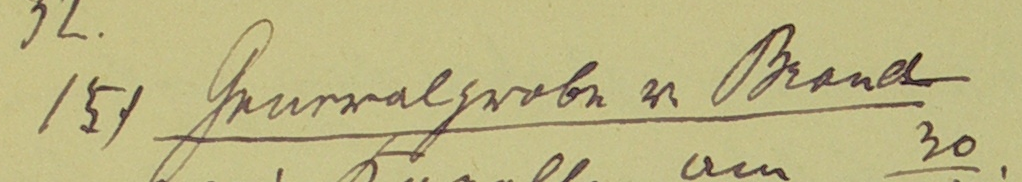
15.) Generalprobe von Brand¬
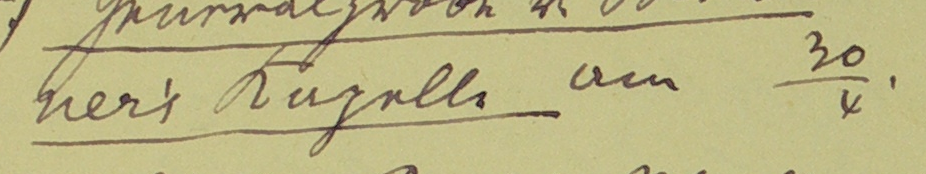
ners Kapelle am 30/4
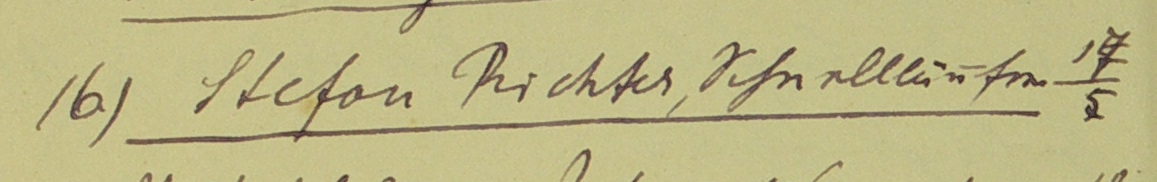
16.) Stefan Richters, Schnellläuten am 17/5
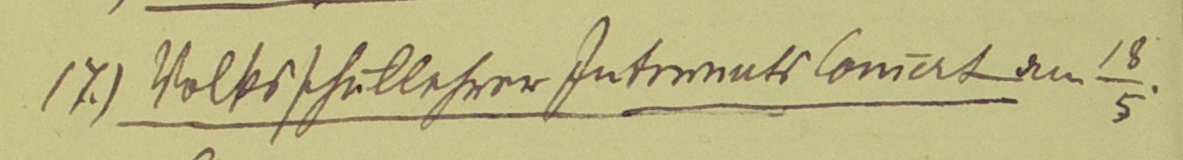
17.) Volksschulleh.Internats Concert am 18/5
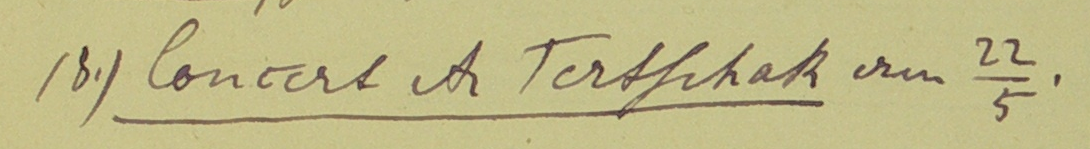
18.) Concert A. Tertschak am 22/5
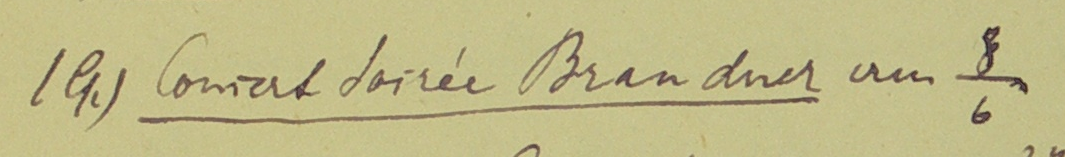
19.) Concert Soiree Brandner am 8/6
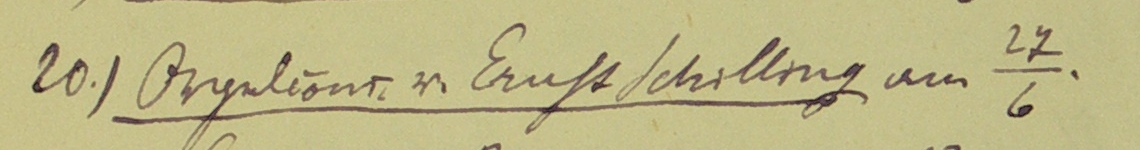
20.) Argelioner von Ernst Schilling am 27/6
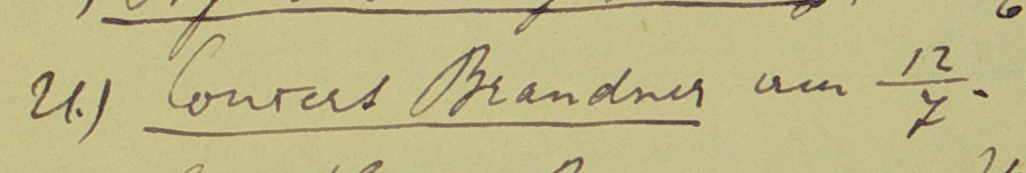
21.) Concert Brandners am 12/7
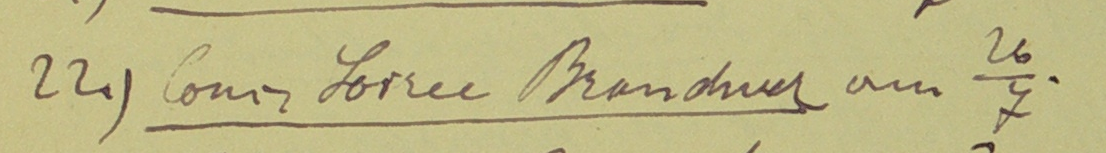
22.) Concert Soiree Brandners am 26/7
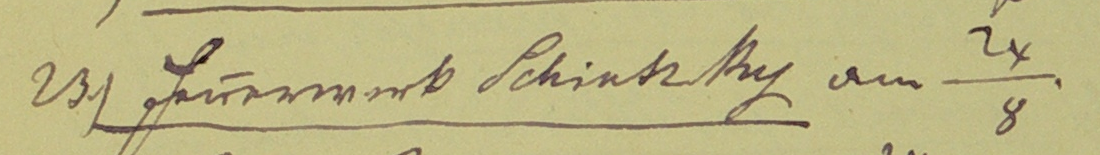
23) Feuerwerk Schintzky am 24/8
